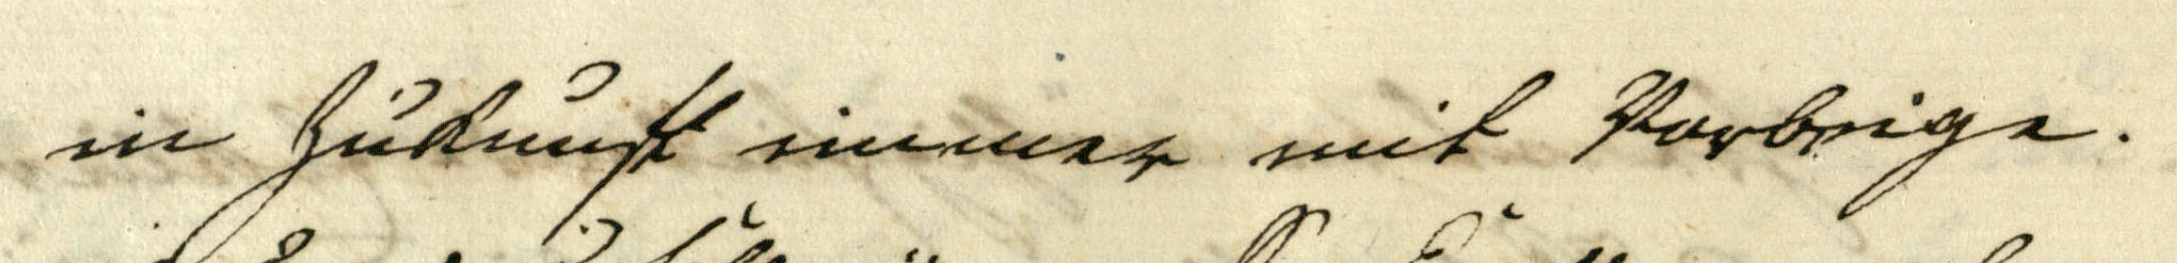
in Zukunft immer mit Vorbeige¬
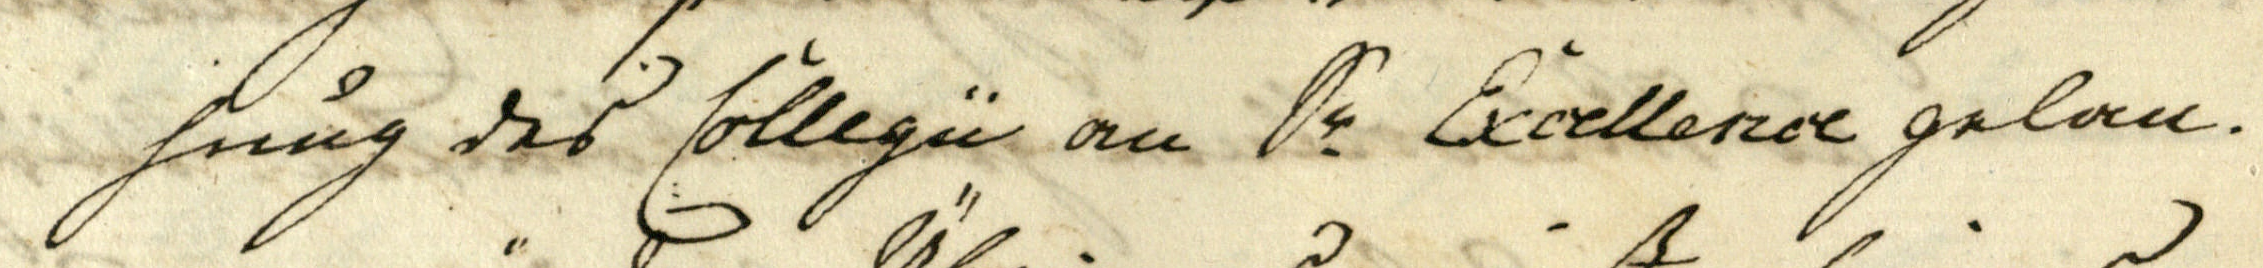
hung des Collegii an Sr Excellence gelan¬
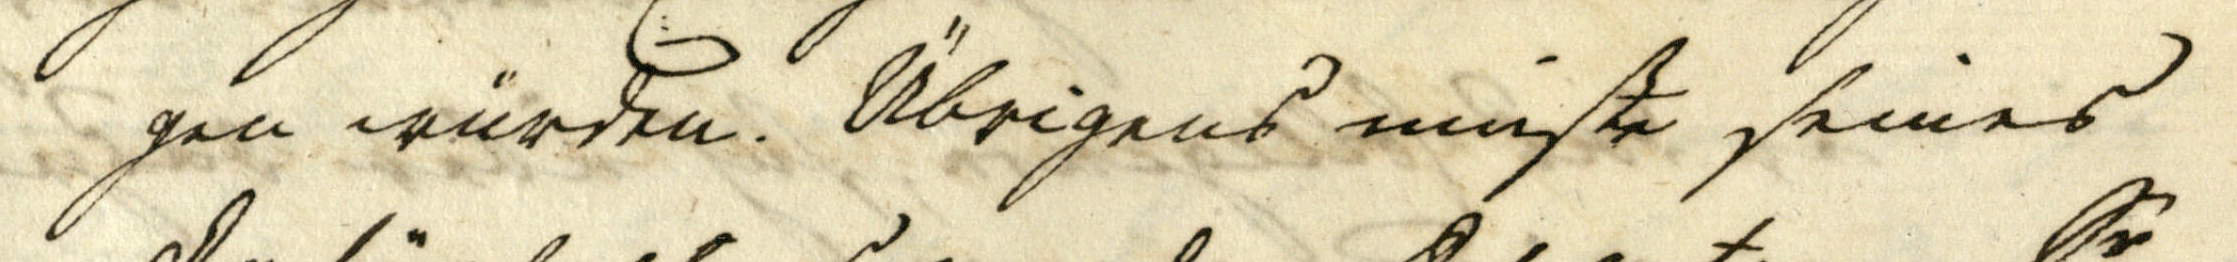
gen würden. Übrigens müßte seines
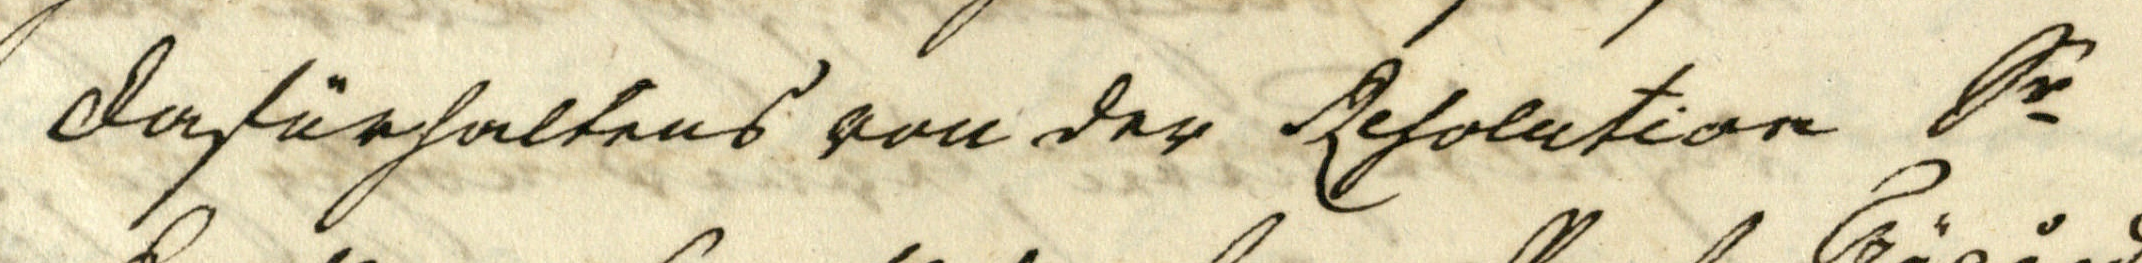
Dafürhaltens von der Resolution Sr
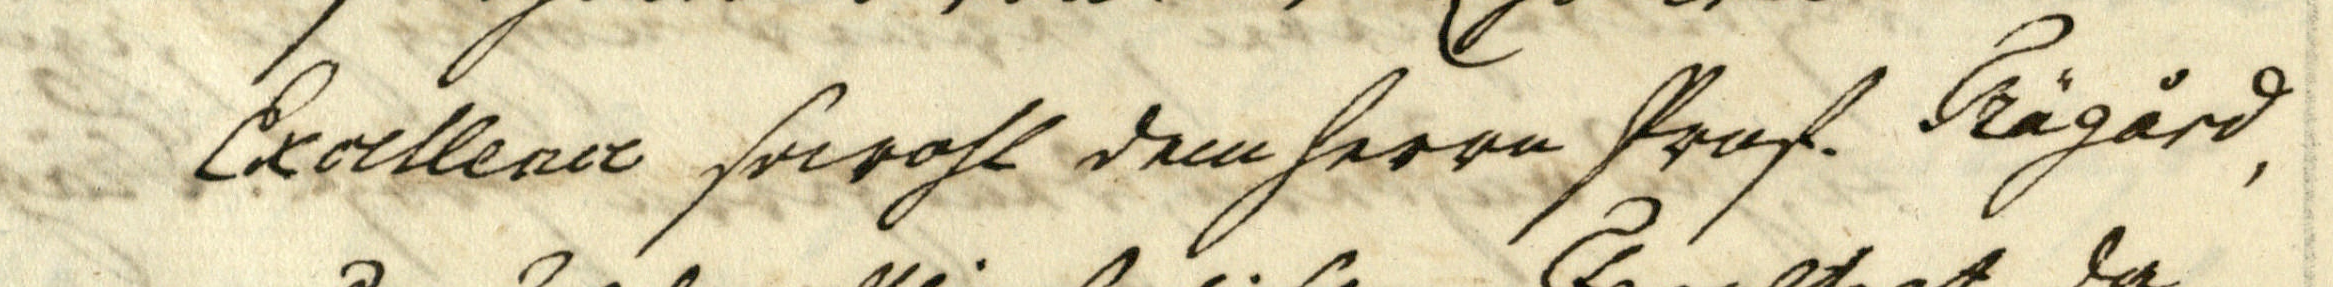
Excellence sowohl dem Herrn Prof. Trägård
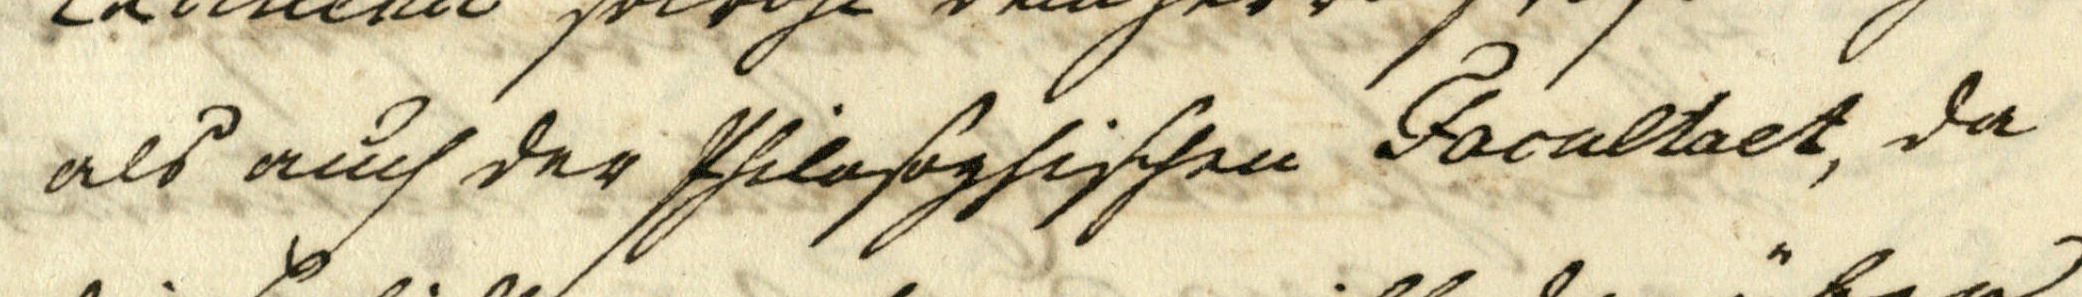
als auch der Philosophischen Facultaet, da
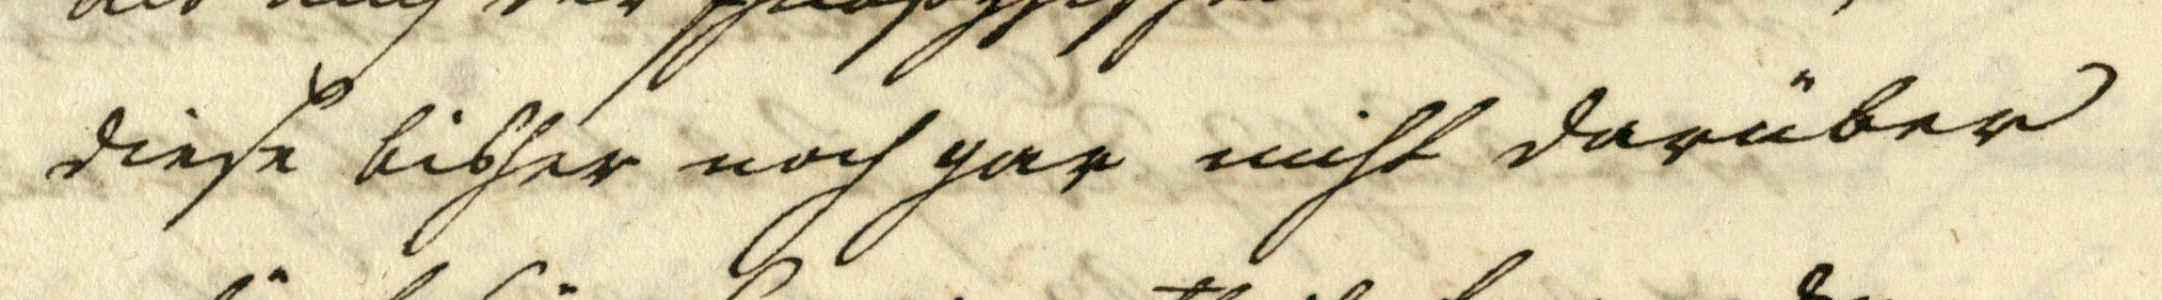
diese bisher noch gar nicht darüber
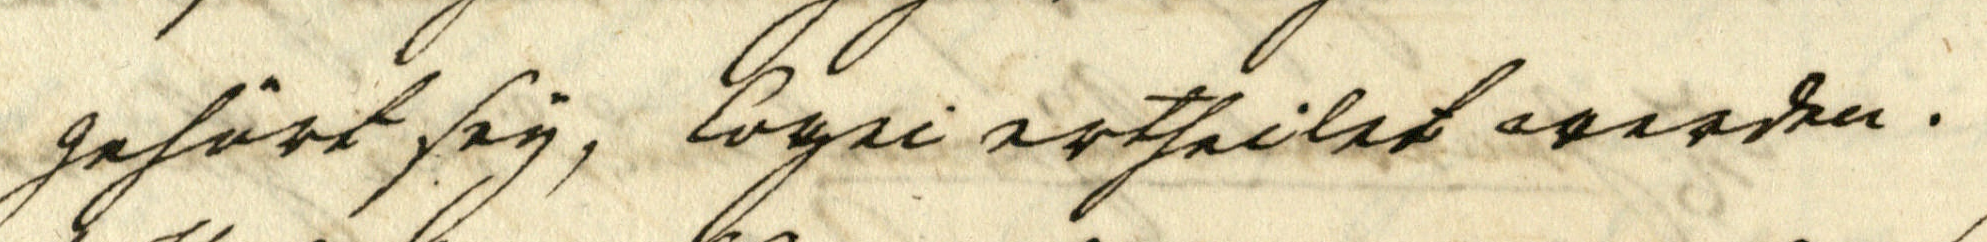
gehört seÿ, Copei ertheilet werden.
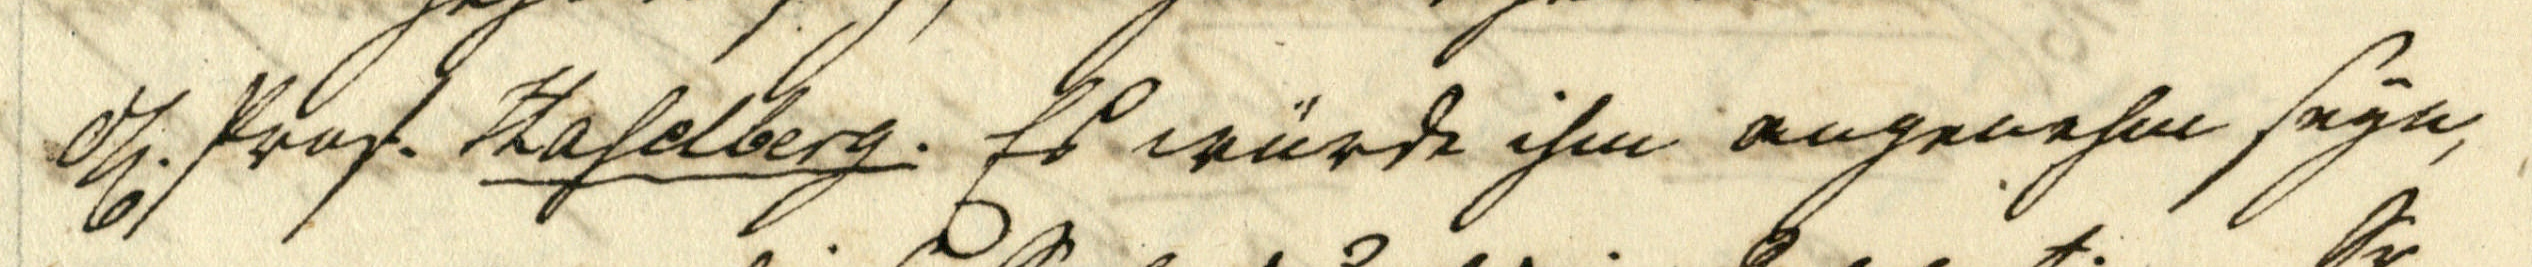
dh. Prof. Haselberg. Es würde ihm angenehm seÿn,
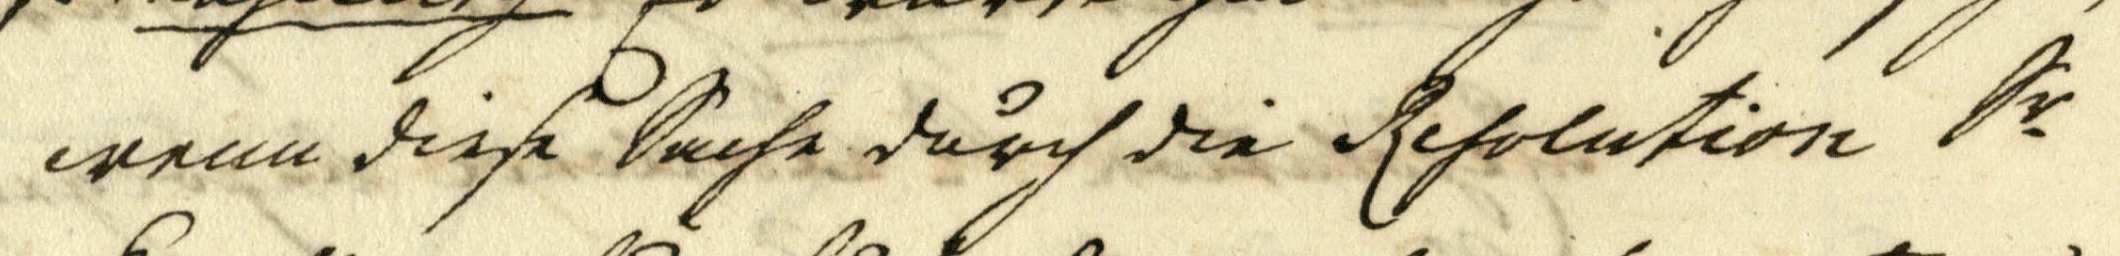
wenn diese Sache durch die Resolution Sr
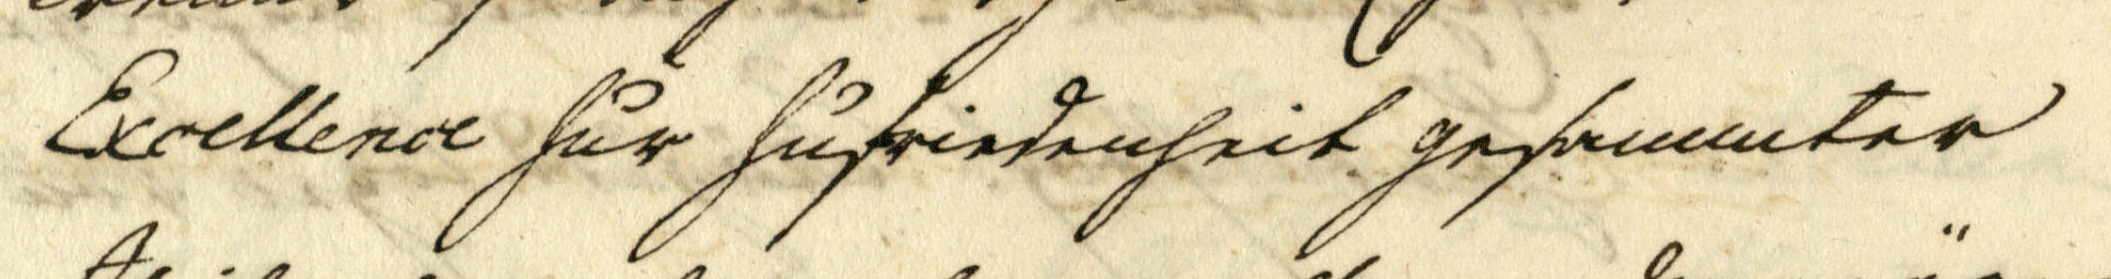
Excellence zur Zufriedenheit gesammter
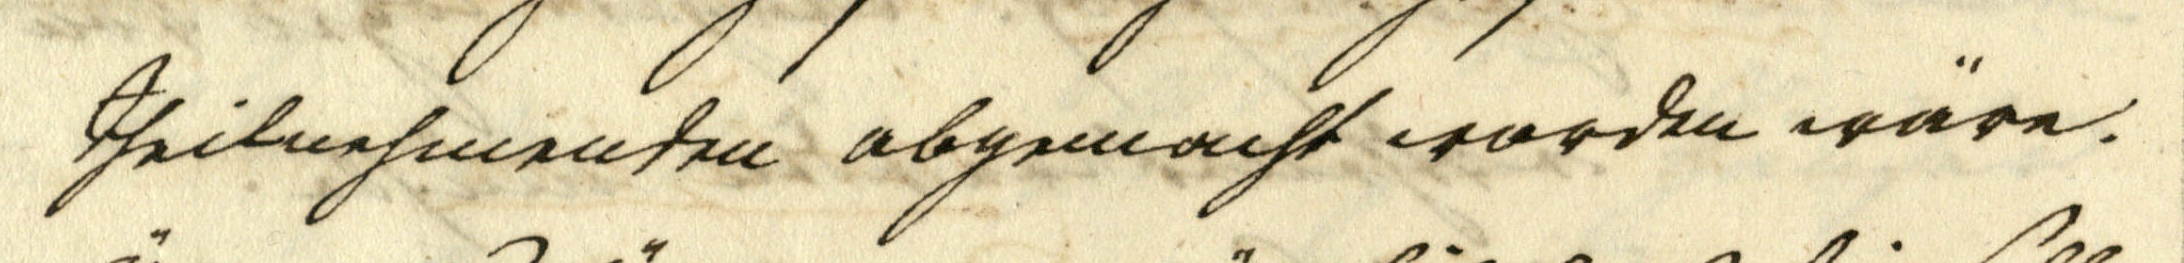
Theilnehmenden abgemacht worden wäre.
